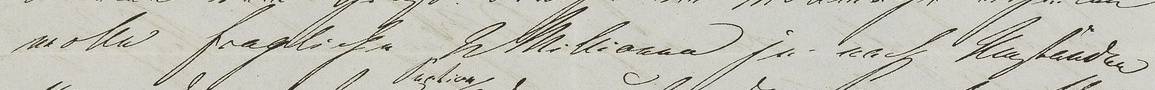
wolle fragliche 2 Millionen je nach Umständen
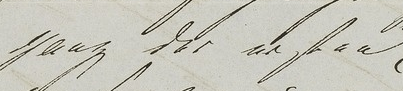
ganz der ersten
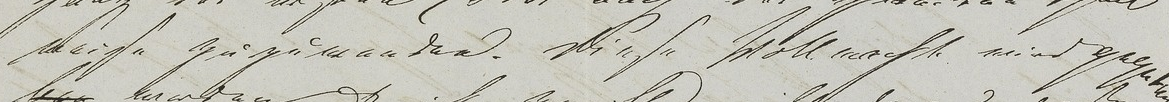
weise zuzuwenden. Diese Vollmacht wird gegeben
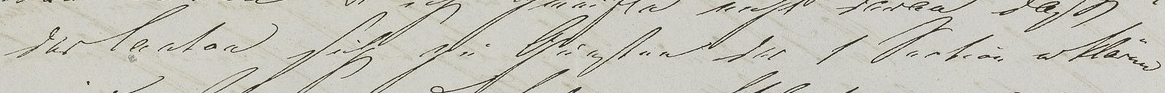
der Canton sich zu Gunsten der 1 Section erklären
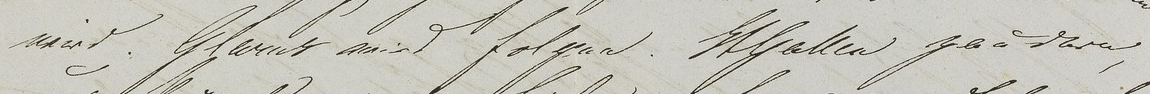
wird. Glarus wird folgen. St Gallen zaudern,
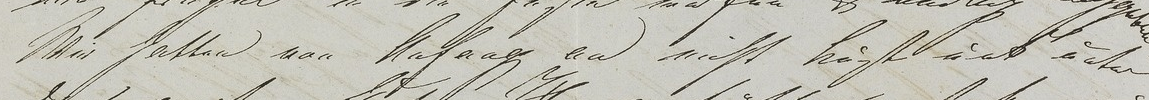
Wir hatten von Anfang an nicht Lust uns unter
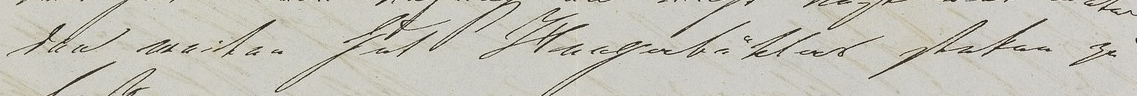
den weiten Hut Hungerbühlers steken zu
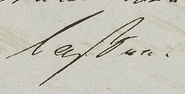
lassen.
